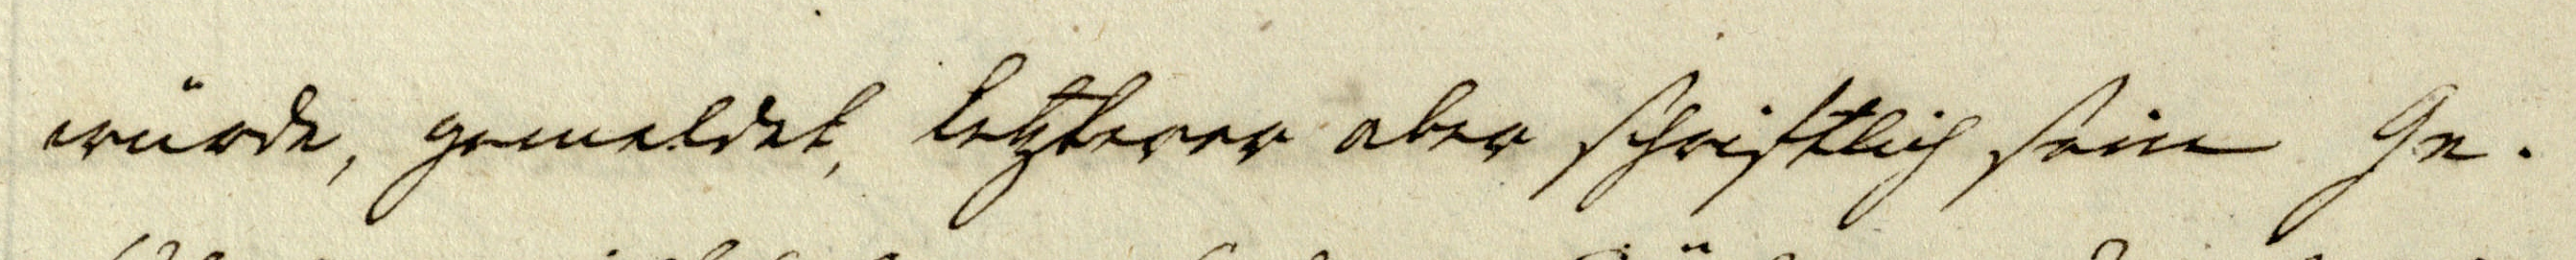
würde, gemeldet, letzterer aber schriftlich sein Ge¬
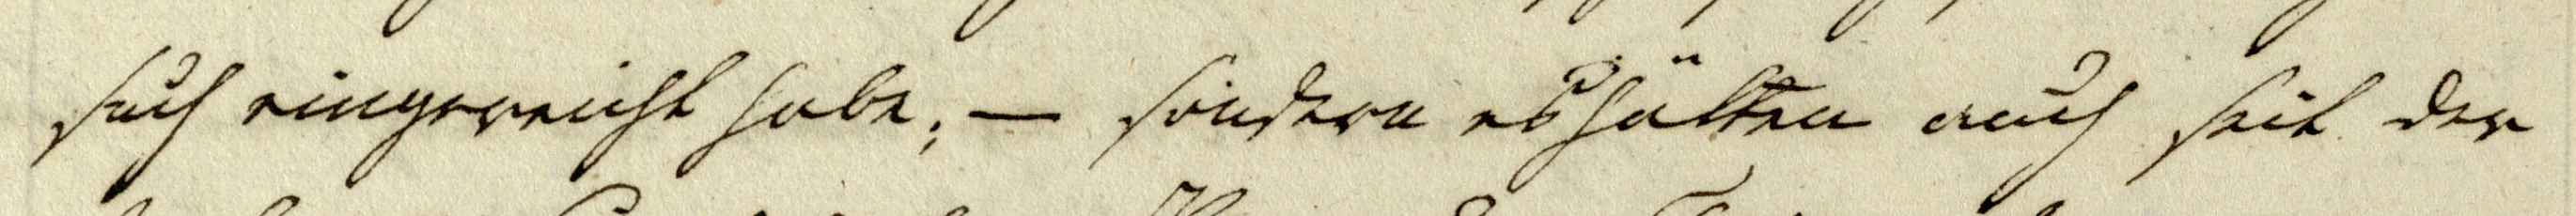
such eingereicht habe; - sondern es hätten auch seit der
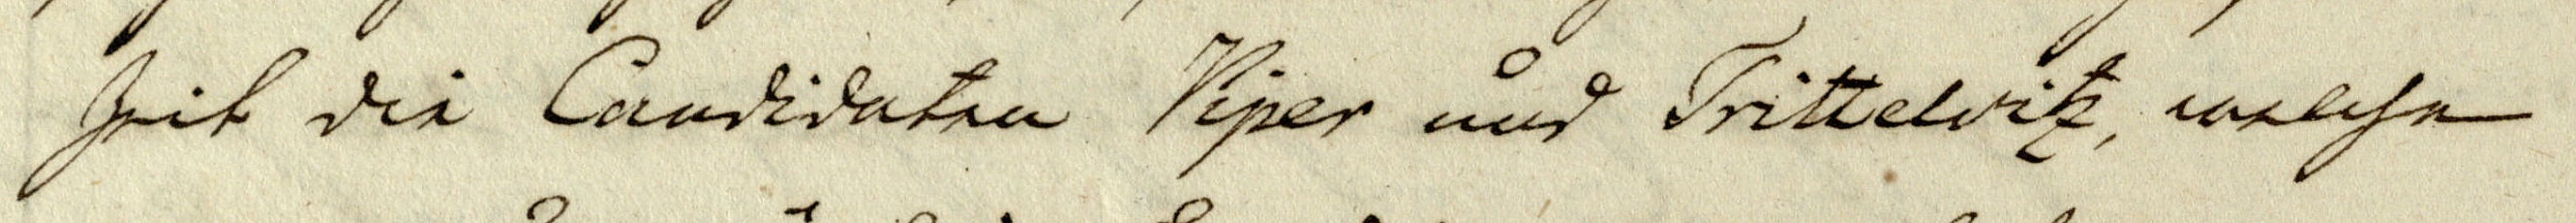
Zeit die Candidaten Piper und Trittelvitz, welche
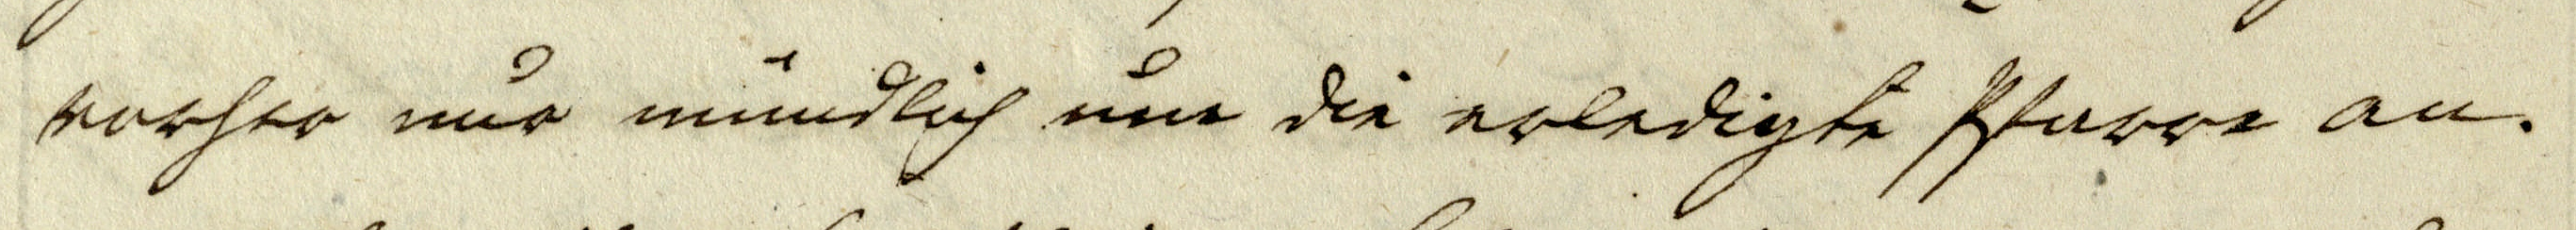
vorher nur mündlich um die erledigte Pfarre an¬
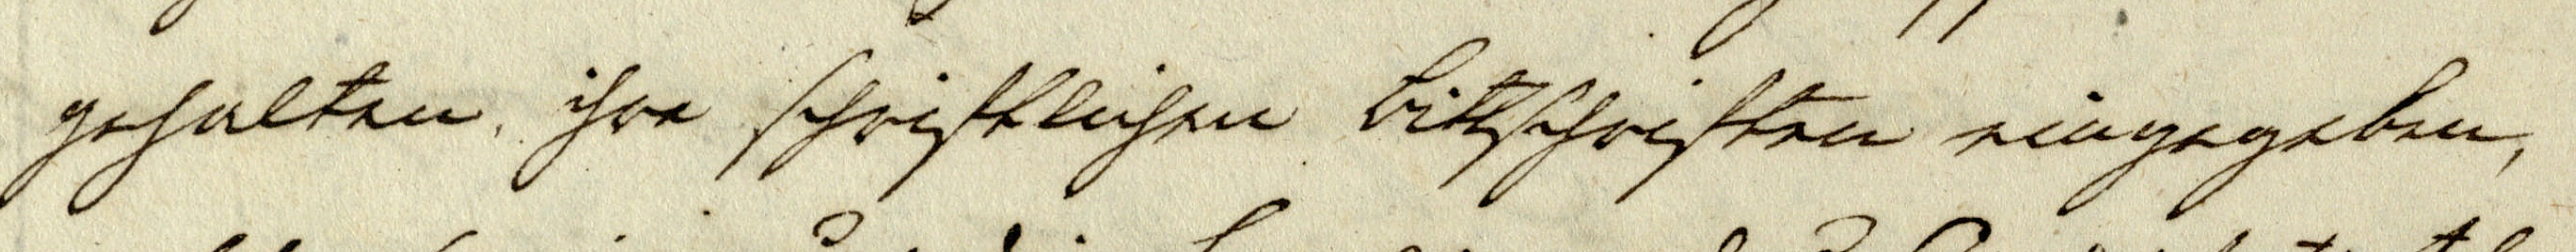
gehalten, ihre schriftlichen Bittschriften eingegeben,
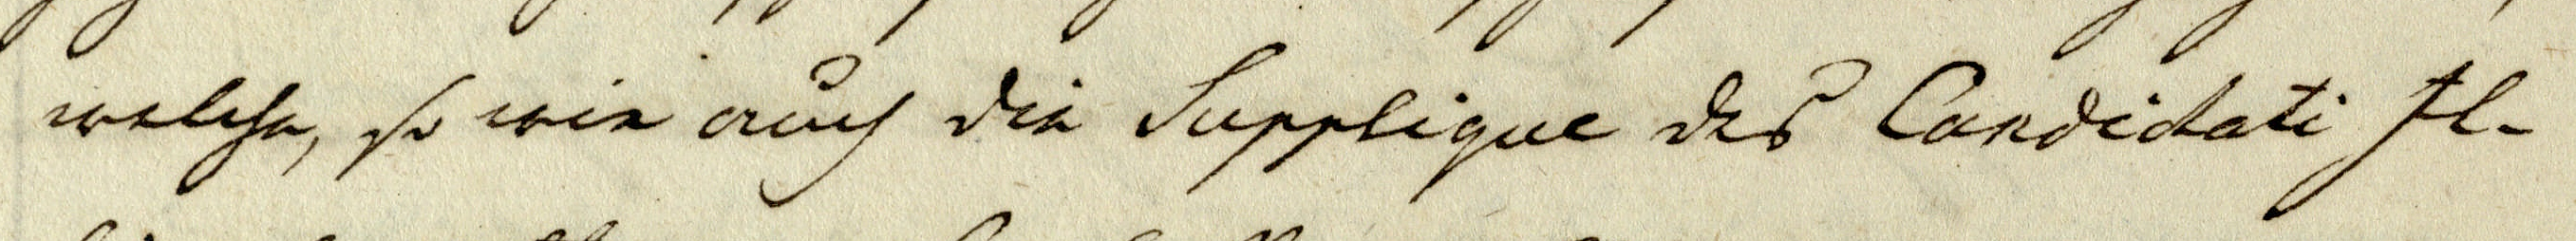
welche, so wie auch die Supplique des Candidati Il¬
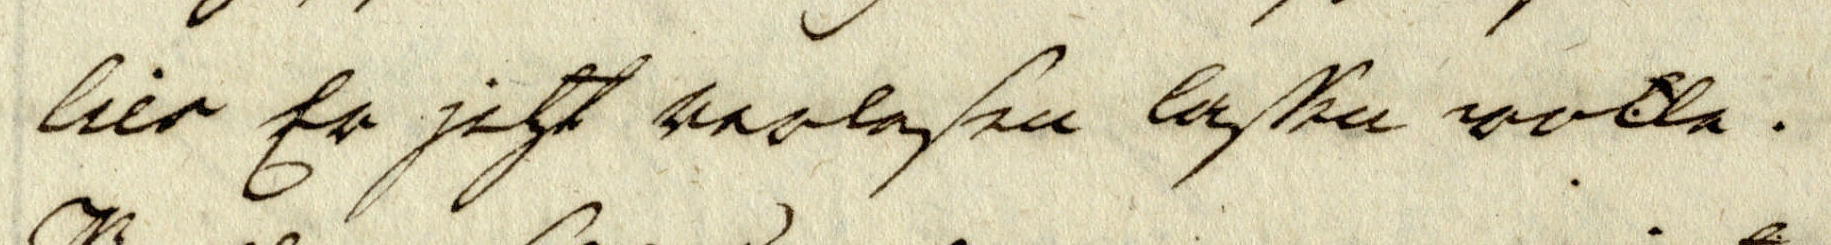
lies Er jetzt verlesen lassen wolle.
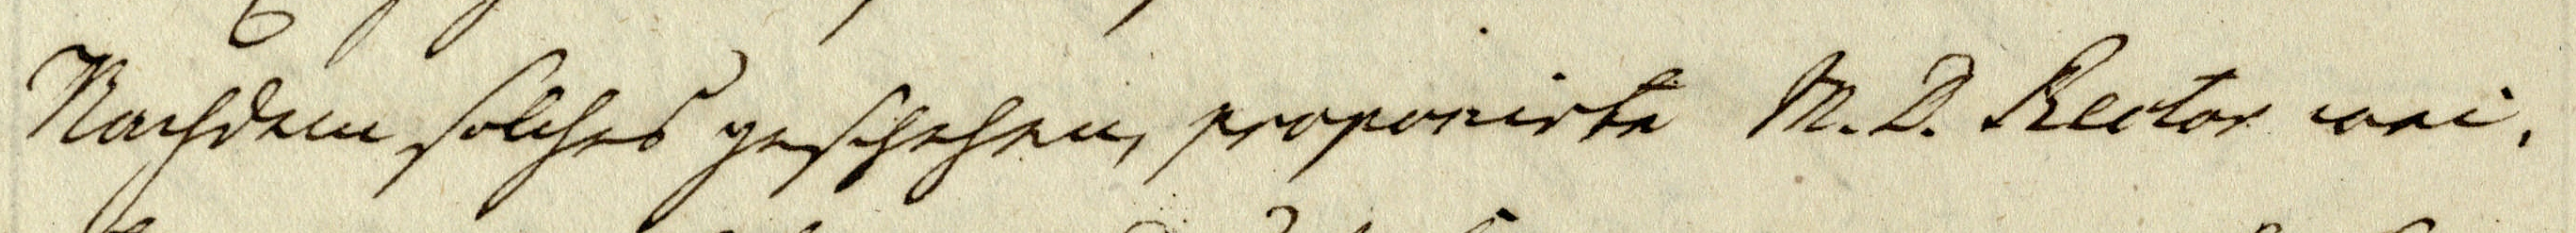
Nachdem solches geschehen, proponirte M. D. Rector wei¬
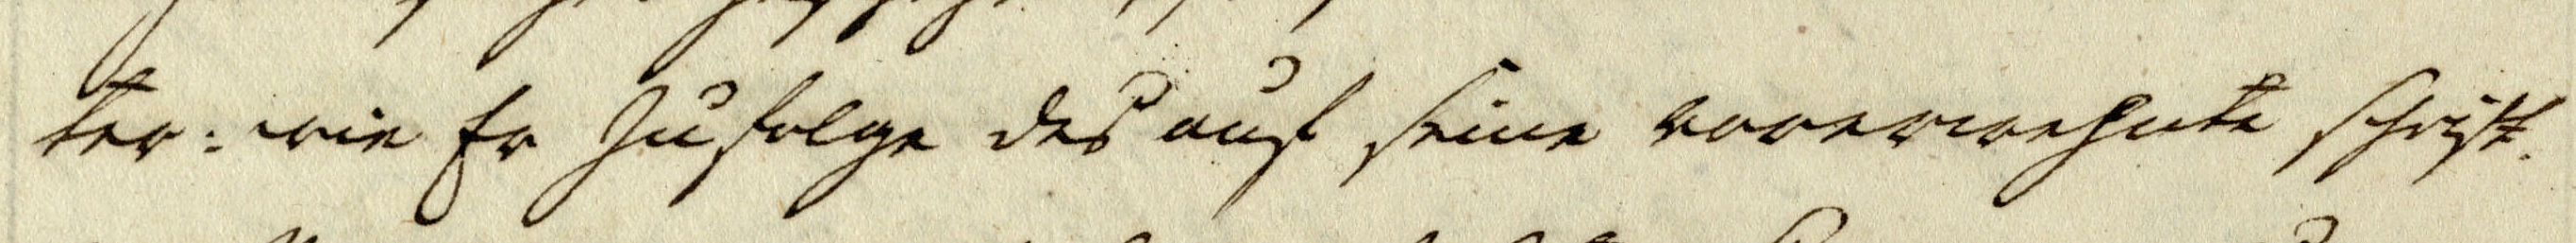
ter: wie Er zufolge des auf seine vorerwehnte schrift¬
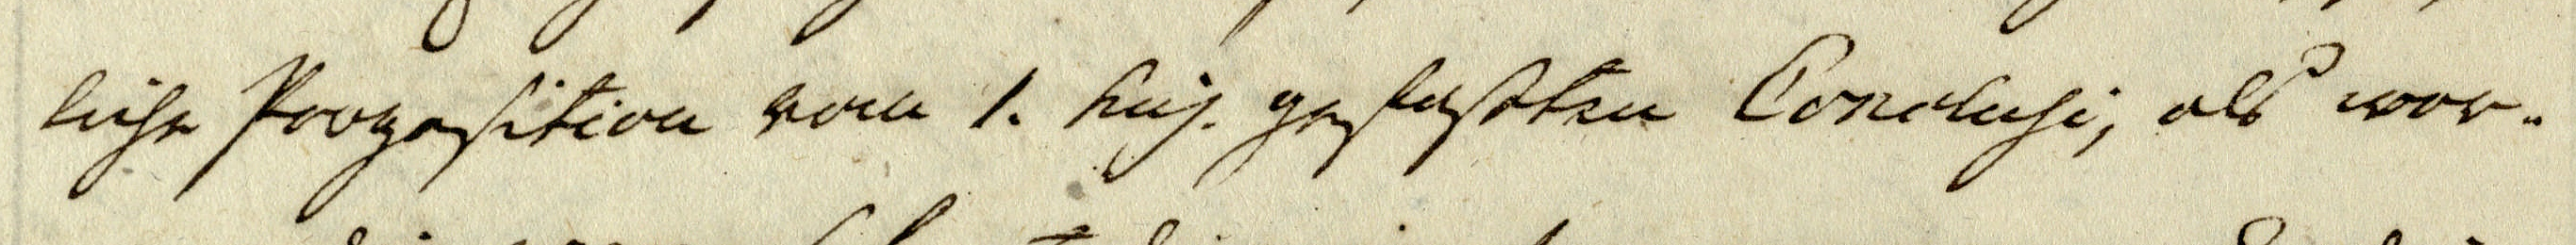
liche Proposition vom 1. huj. gefaßten Conclusi; als wor¬
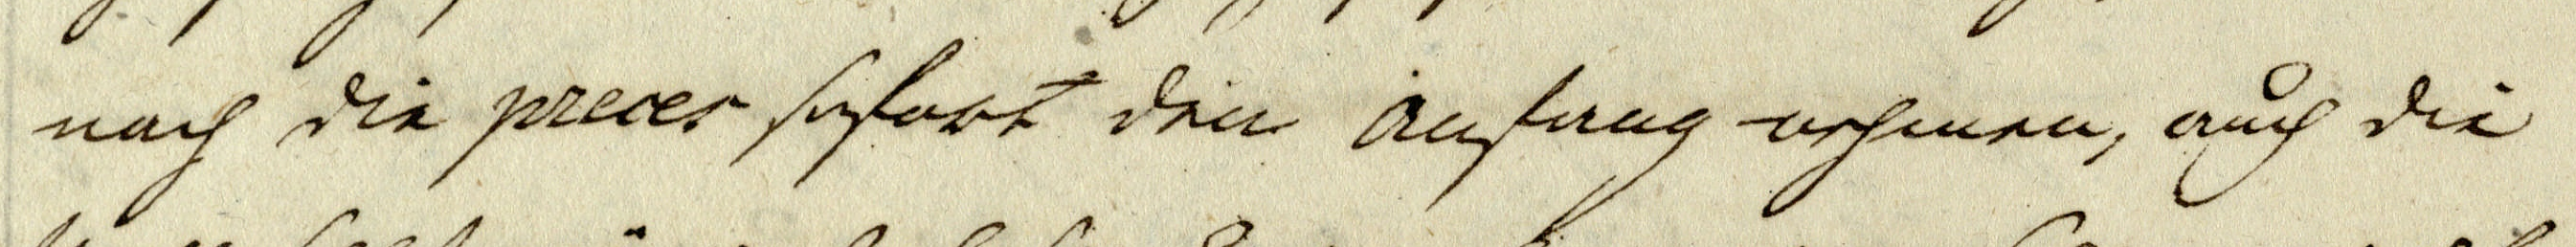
nach die preces sofort den Anfang nehmen, auch die
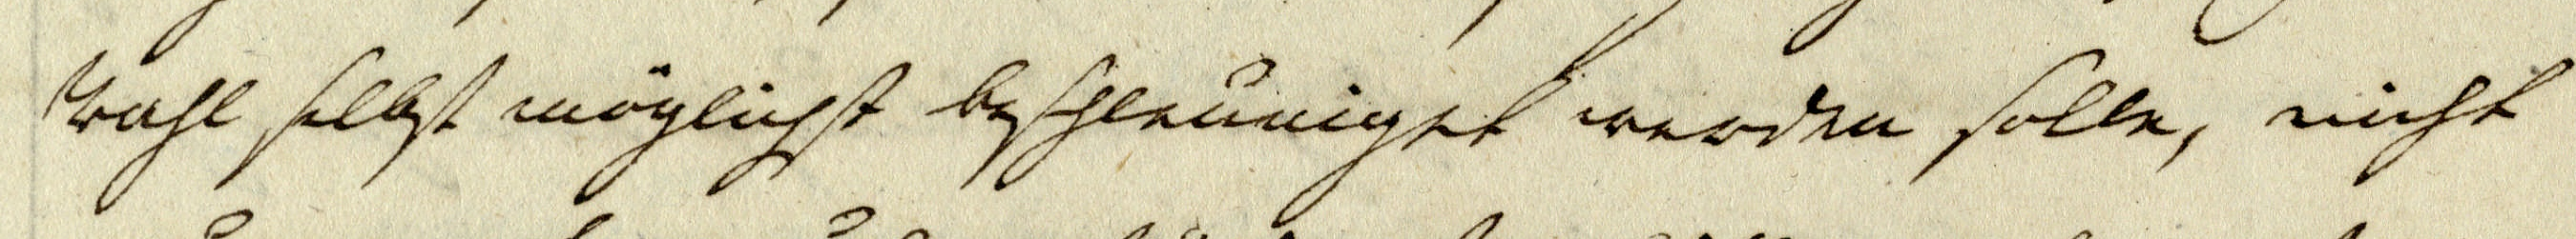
Wahl selbst möglichst beschleuniget werden solle, nicht
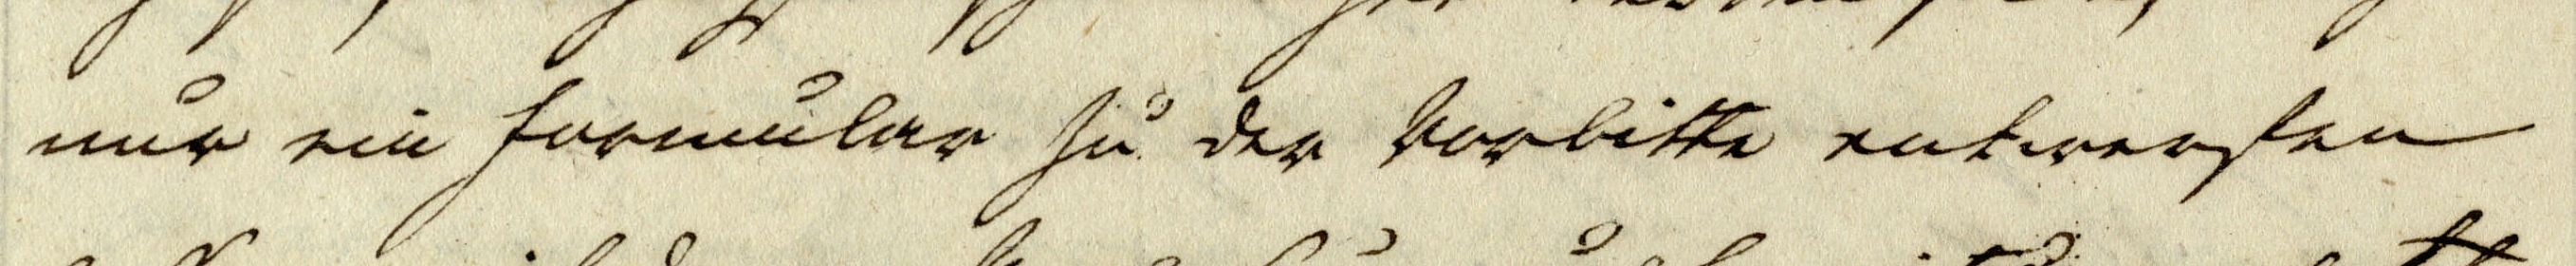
nur ein Formular zu den Vorbitte entwerfen
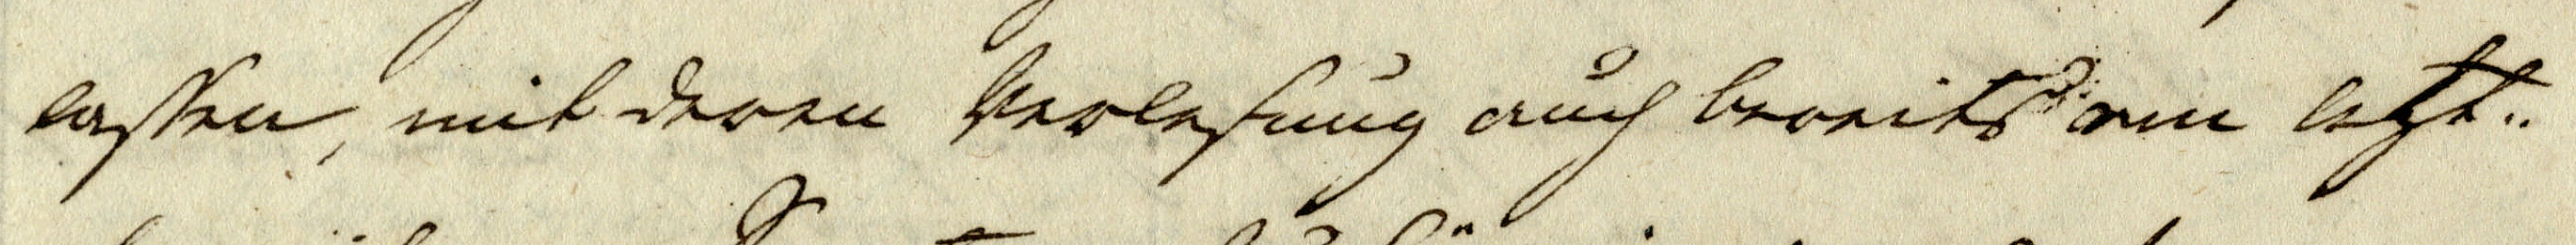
lassen, mit deren Verlesung auch bereits am letzt¬
